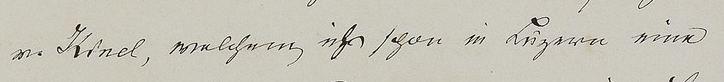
v. Kinel, welchem ich schon in Luzern eine
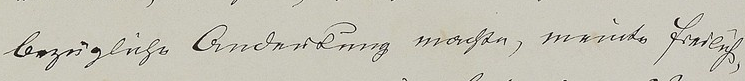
bezügliche Andeutung machte, meinte freilich,
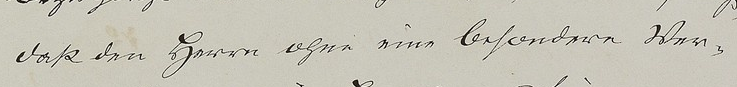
daß den Herrn ohne eine besondere Ver-
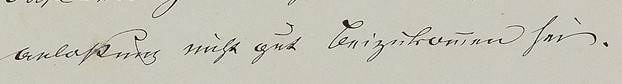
anlaßung nicht gut beizukommen sei.
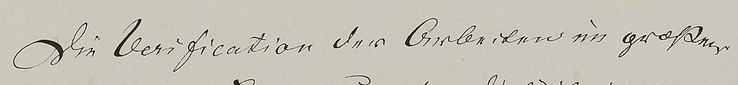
Die Verification der Arbeiten im großen
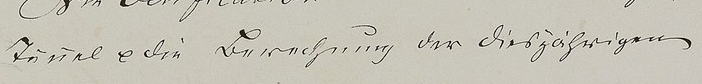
Tunnel & die Berechnung der diesjährigen
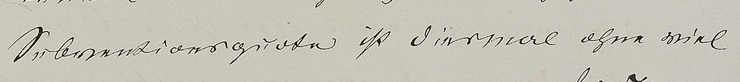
Subventionsquote ist diesmal ohne viel
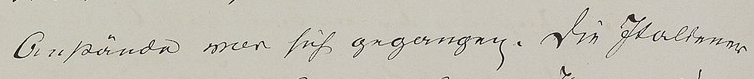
Anstände von sich gegangen. Die Italiener
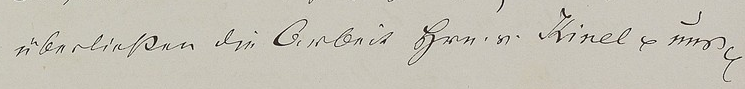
überließen die Arbeit Hrn. v. Kinel & uns
